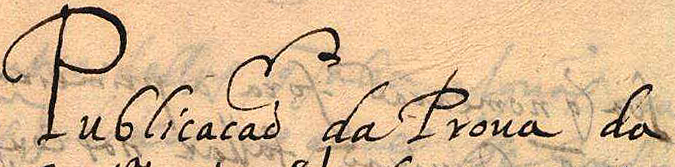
Publicação da Proua da
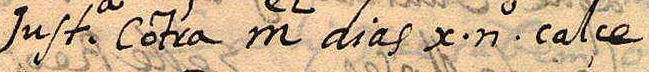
Just.a Cōtra mer dias x. no. calçe
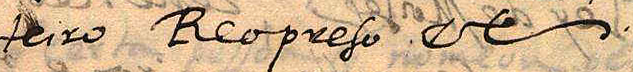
teiro Reo preso et
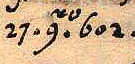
27.9ro.6o2.
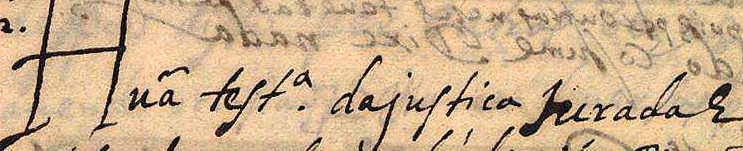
Huā testa. da justiça Jurada E
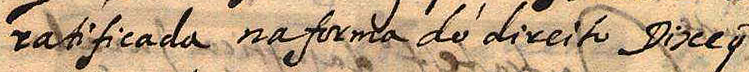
ratificada na forma do direito Dixe q̄
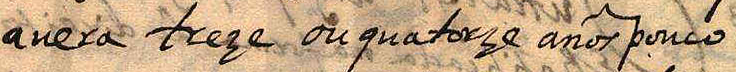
auera treze ou quatorze anōs pouco
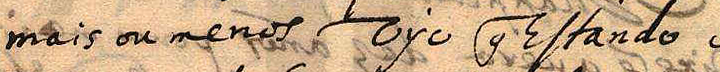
mais ou menos Vyo q̄ Estando o
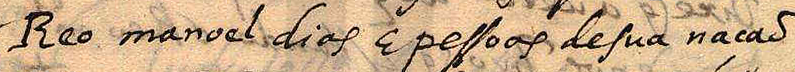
Reo manoel dias E pessoas de sua naçaõ
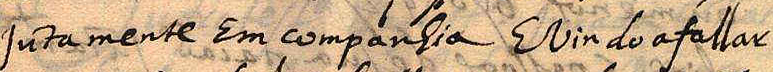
Jūtamente Em companhia E vindo a fallar
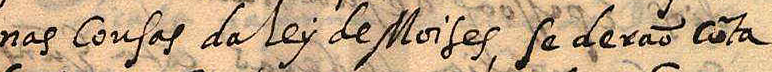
nas Cousas da Ley de Moises, se deraõ cōta
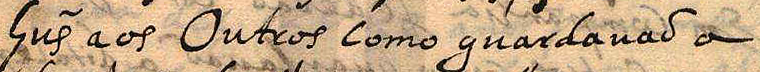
hus̄ aos Outros Como guardauaõ a
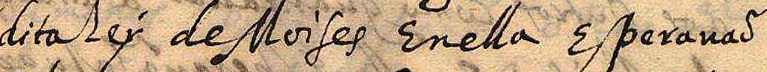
dita Ley de Moises E nella Esperauaõ
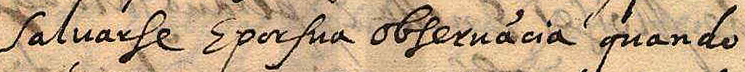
saluarse E por sua obseruācia quando
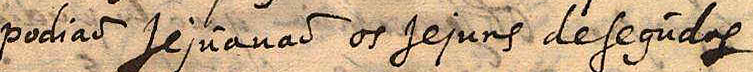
podiaõ Jejuāuaõ os Jejuns de segūdas
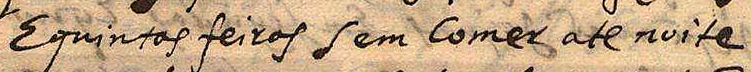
E quintas feiras sem Comer ate noite
